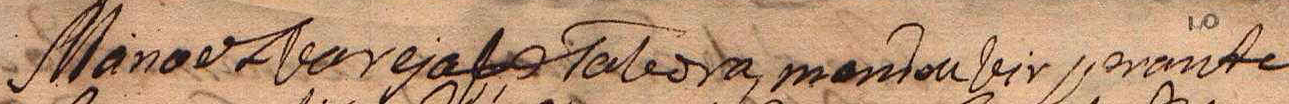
Manoel Varejaõ, e Tavora, mandou vir perante
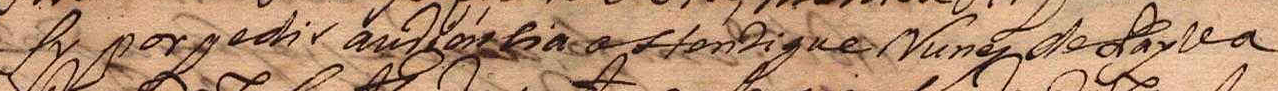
sy por pedir audiencia a Henrique Nunes de Payva
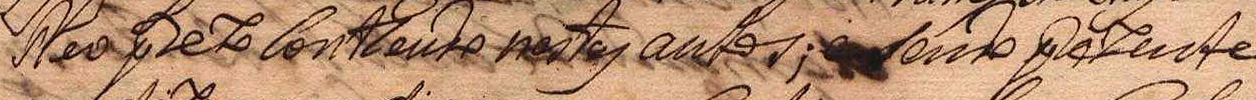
Reo pRezo Contheudo nestes autos; e sendo pRezente
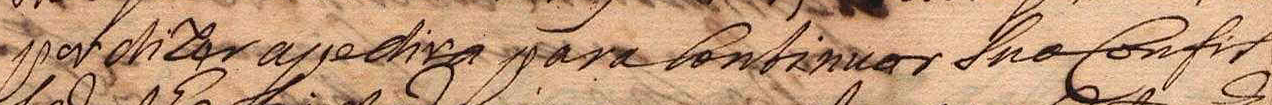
por dizer a pedira para continuar sua Confis
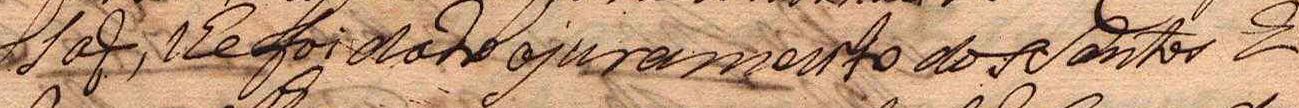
saõ, lhe foi dado o juramento dos Santos E
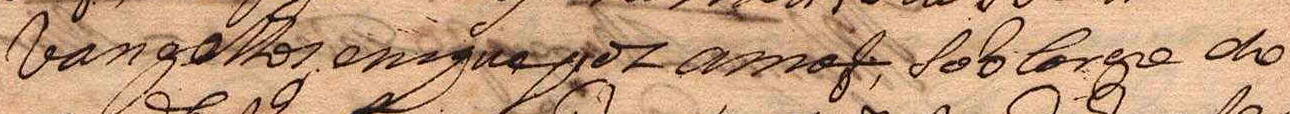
vangelhos em que poz a maõ, sob Cargo do
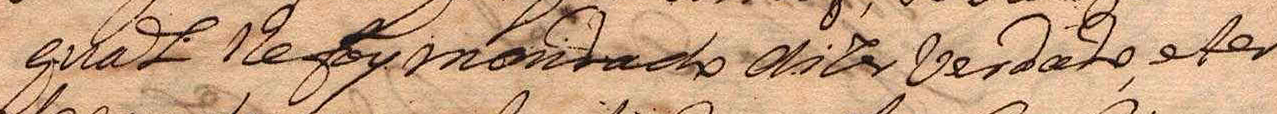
qual lhe foy mandado dizer verdade, e ter
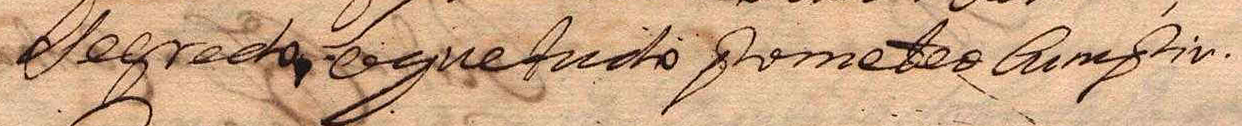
Segredo, e que tudo pRometeo cumpRir.
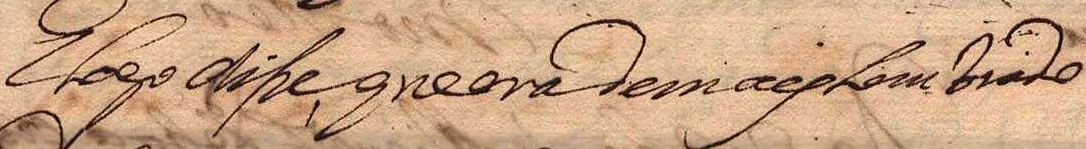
Logo disse, que era de mais Lembrado
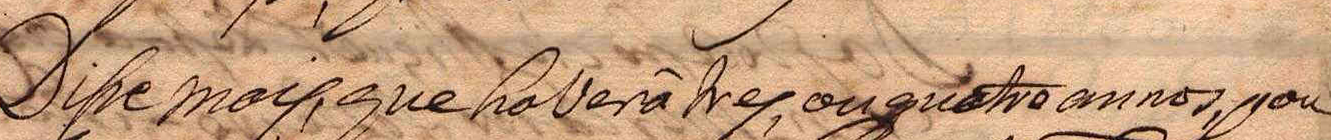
Disse mais, que haverá tres, ou quatro annos, pou
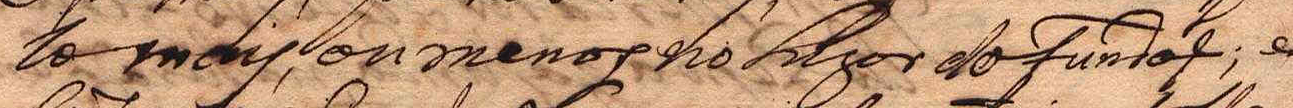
co mais, ou menos no Lugar do Fundaõ; e
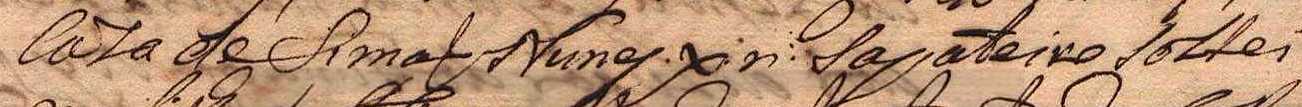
Caza de Simaõ Nunes. x.n. sapateiro soltei
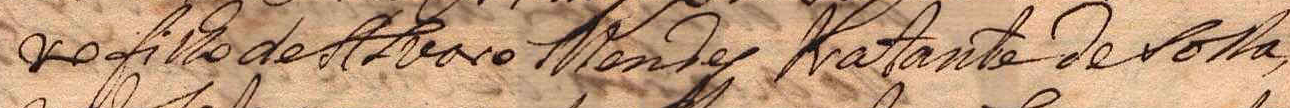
ro filho de Alvaro Mendes tratante de Solla,
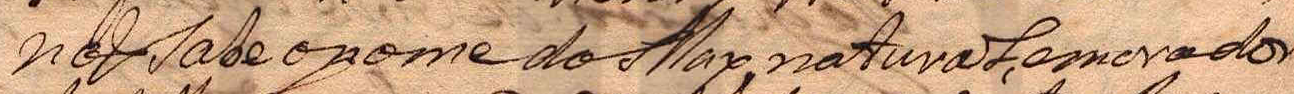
naõ sabe o nome da May, natural, e morador
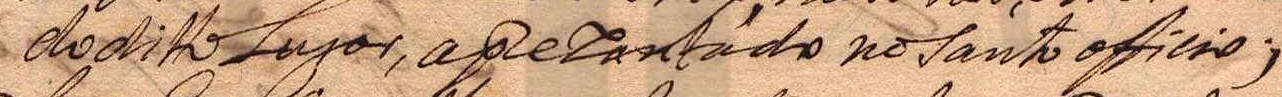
do dito Lugar, apRezantado no santo officio;
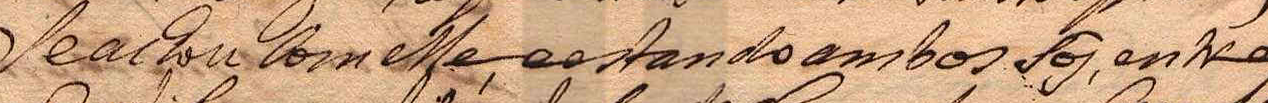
se achou com elle, e estando ambos sos, entre
